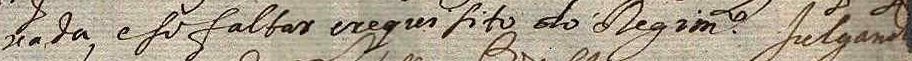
uada, e só faltar o requisito do Regm.to Julgand
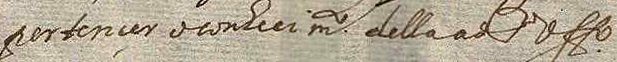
pertençer o conhecim.to della ao S.to off.o
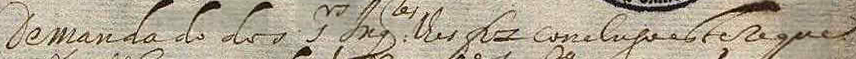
De mandado dos s.rs Inq.res lhes fiz concluso este Reque
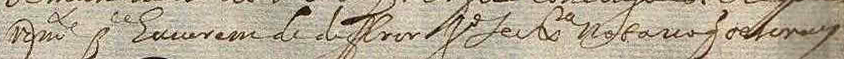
rim.to pa hauerem de deferir J.o Teix.ra notario q̄ o escrevj
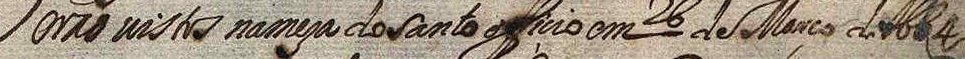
Foraõ uistos na meza do santo officio em 26 de Março de 1664
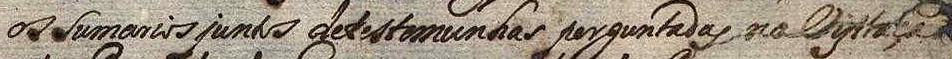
os sumarios juntos de testemunhas perguntadas na Vizitaça
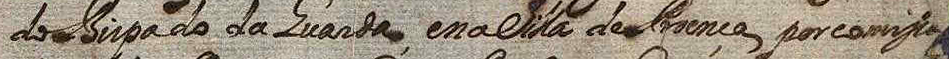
do Bispado da Guarda, e na Villa de Proença por comissa
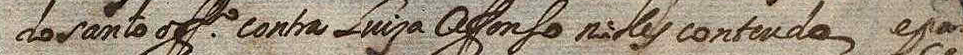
do santo off.o contra Luiza Affonso nelles conteuda e pa
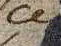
çe
